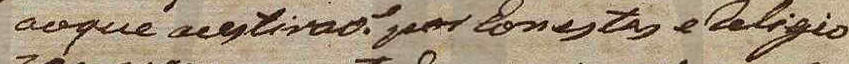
ao que acestiraõ por honestas e Religio
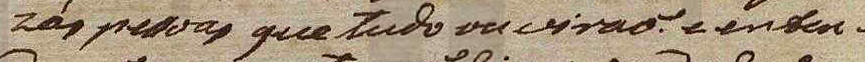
zas pessoas que tudo ouviraõ e enten
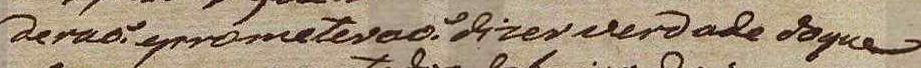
deraõ e prometeraõ dizer verdade do que
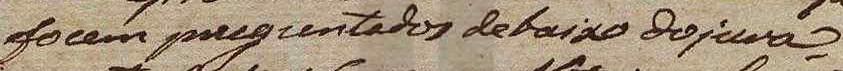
focem preguntados debaixo do jura
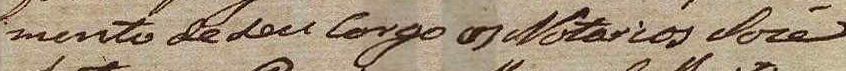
mento de seu Cargo os Notarios Ioze
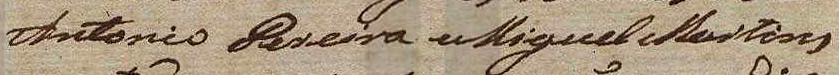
Antonio Pereira e Miguel Martins
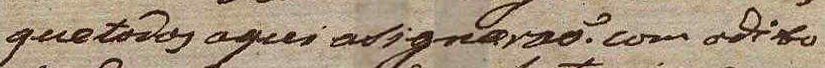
que todos aqui asignaraõ com o dito
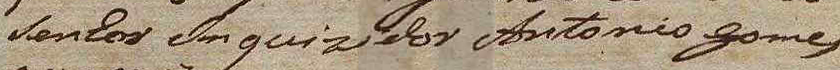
senhor Inquizidor Antonio Gomes
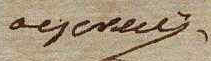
o escreuj
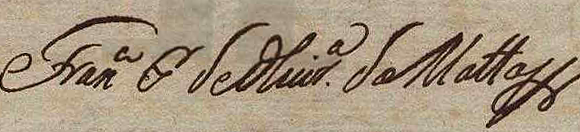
Fran.co x.r de Oliur.a da Matta
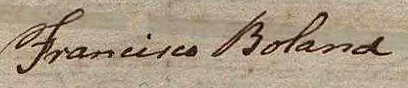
Francisco Boland
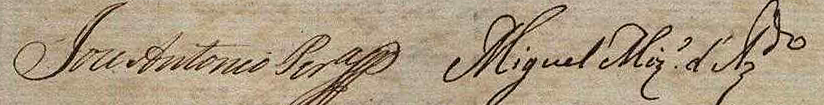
Ioze Antonio Per.a Miguel Miz̄ d'Az.do
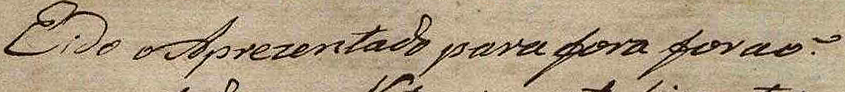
E ido o Aprezentado para fora foraõ
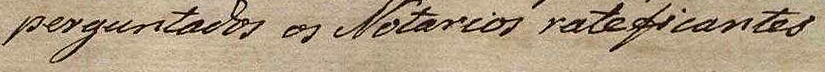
perguntados os Notarios rateficantes
